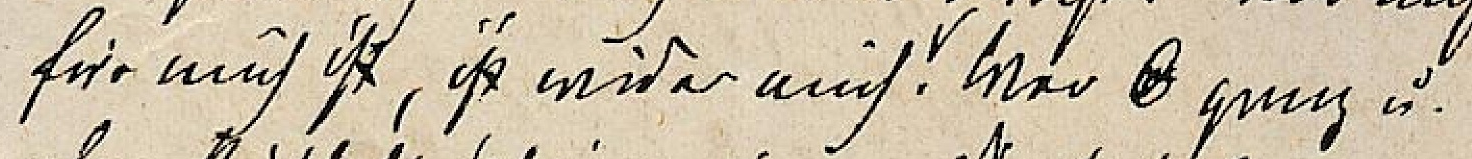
für mich ist, ist wider mich. V Wer o ganz u.
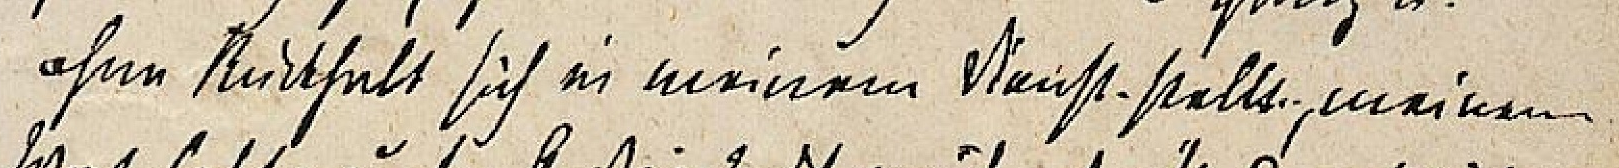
ohne Rückhalt sich in meinem Dienste stellt, meinem
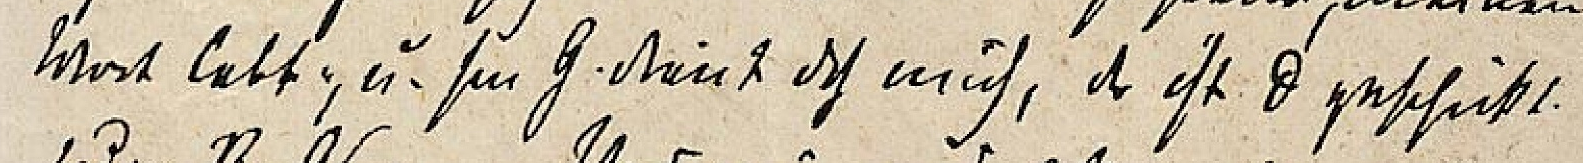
Wort lebt; u. sm G. dient dch mich, der ist o geschickt
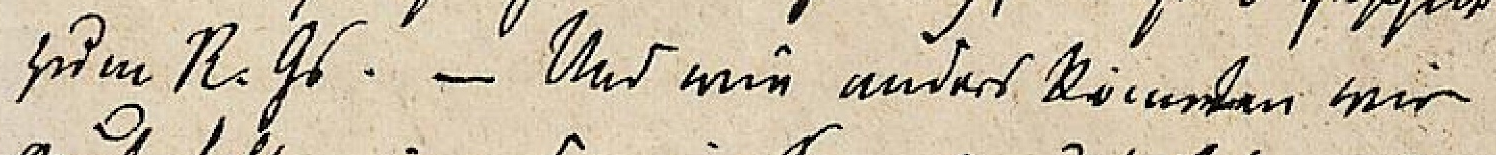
zum R. Gs. _ Und wie anders könnten wir
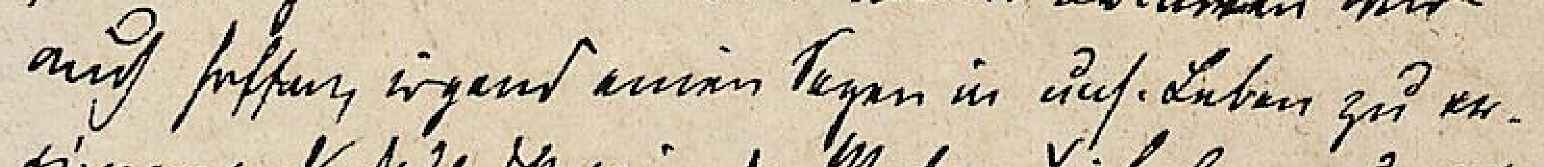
auch hoffen, irgend einen Segen in uns. Leben zu er¬
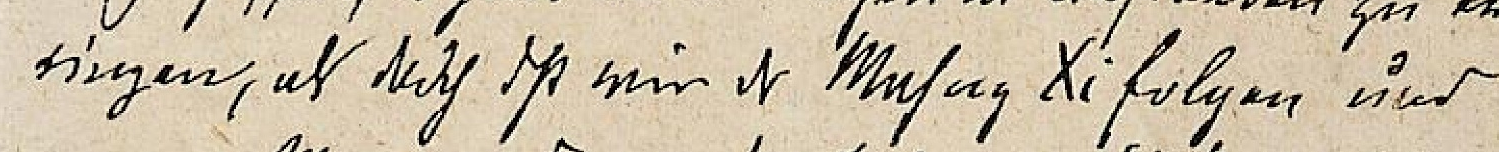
ringen, als durch dß wir dr Mahng Χι folgen und
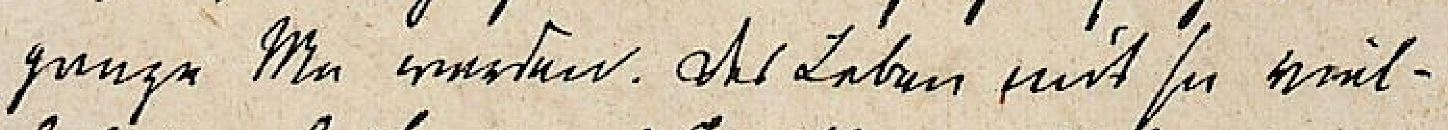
ganze Mn werden. Das Leben mit sn viel¬
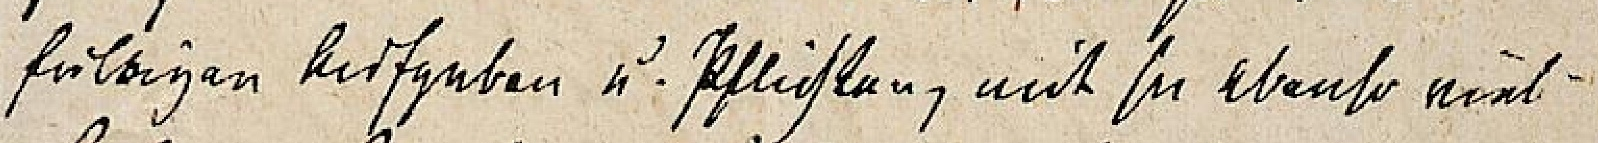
fältigen Aufgaben u. Pflichten, mit sn ebenso viel¬
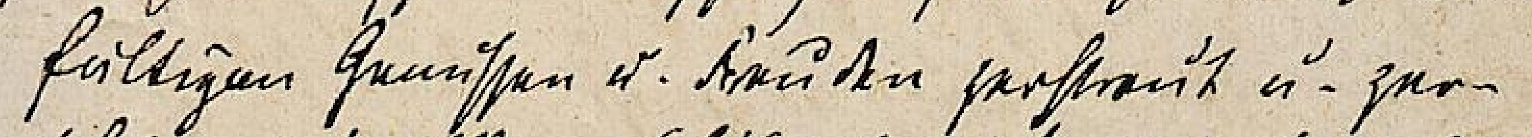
fältigen Genüssen u. Freuden zerstreut u zer¬
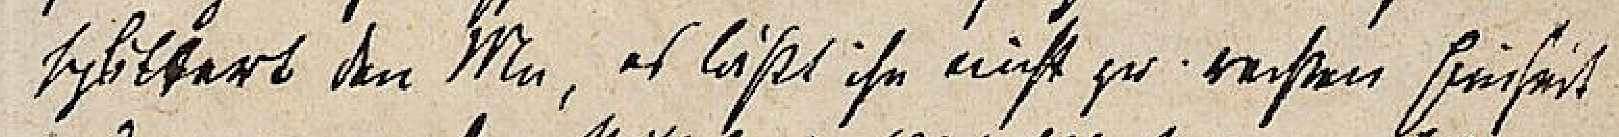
splittert den Mn, es läßt ihn nicht zr. rechten Einheit
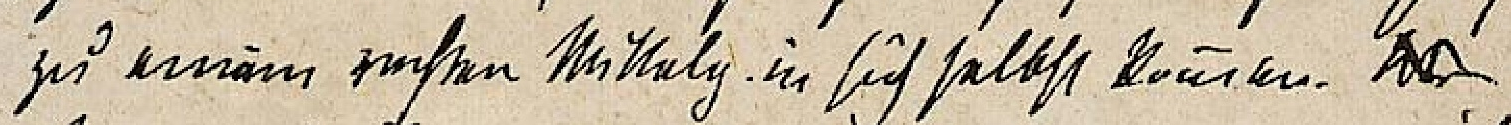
zu einem rechten Mittelg. in sich selbst komen. Wer
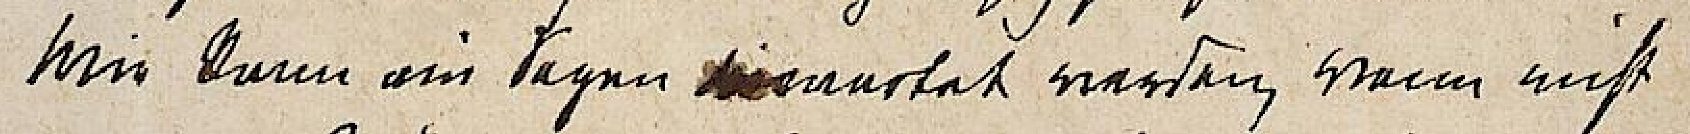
Wie kann ein Segen erwartet werden, wenn nicht
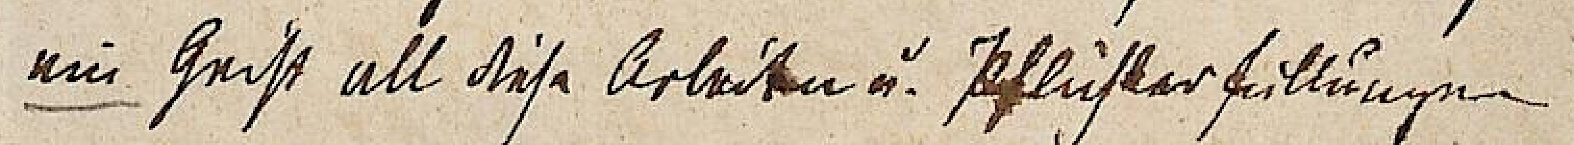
ein Geist all dies Arbeiten u. Pflichterfüllungen
